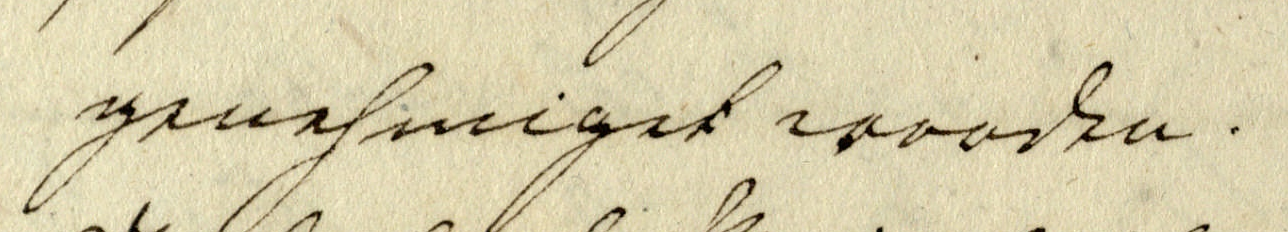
genehmiget worden.
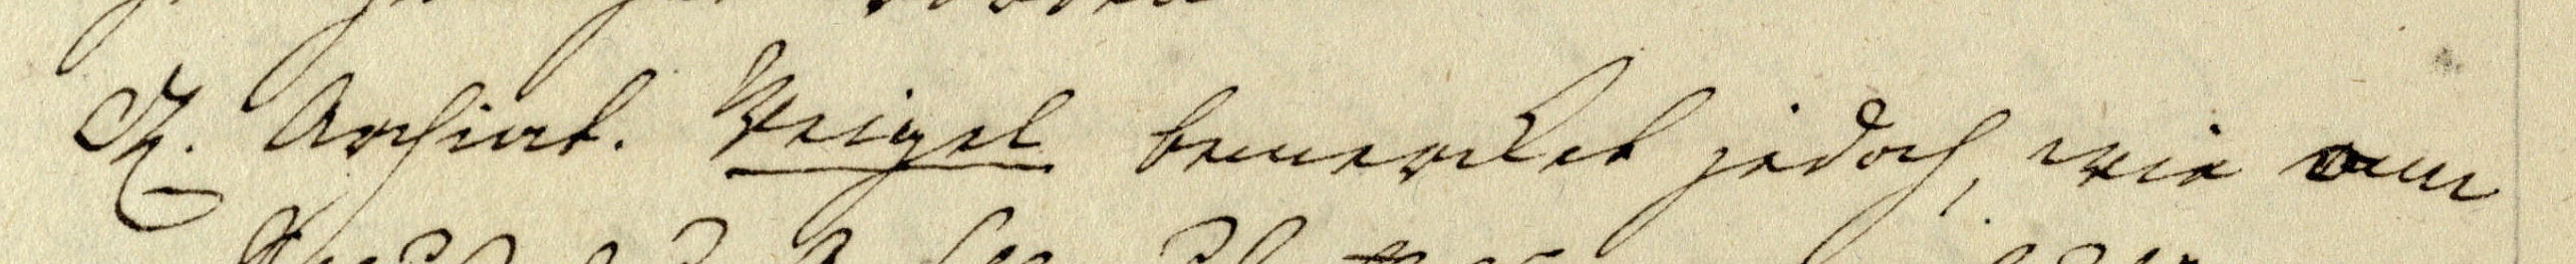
dh. Archiat. Weigel bemercket jedoch, wie am
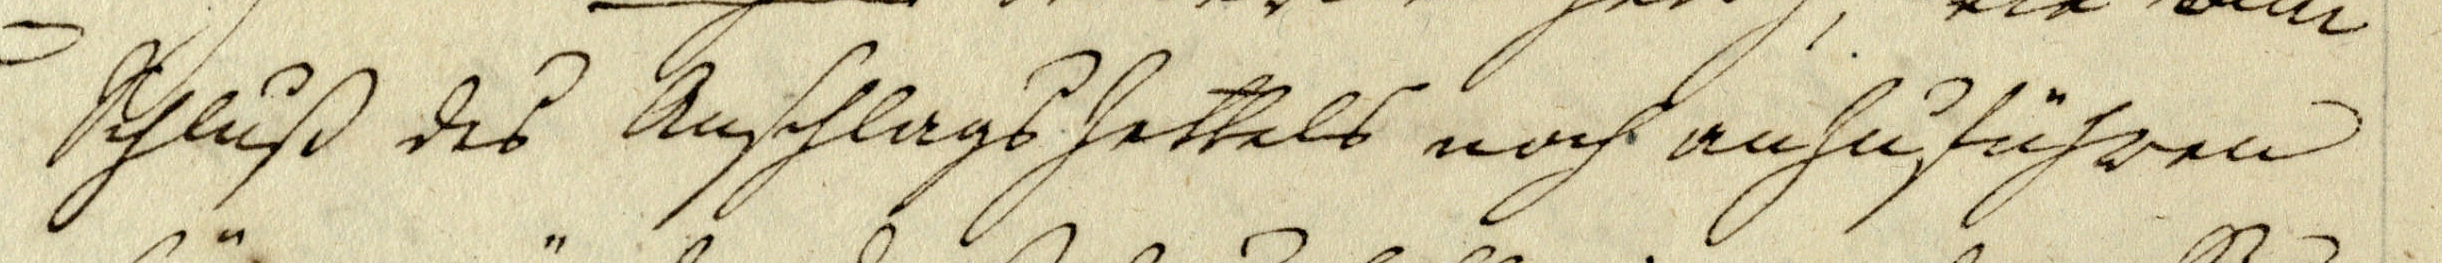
Schluß des Anschlagszettels noch anzuführen
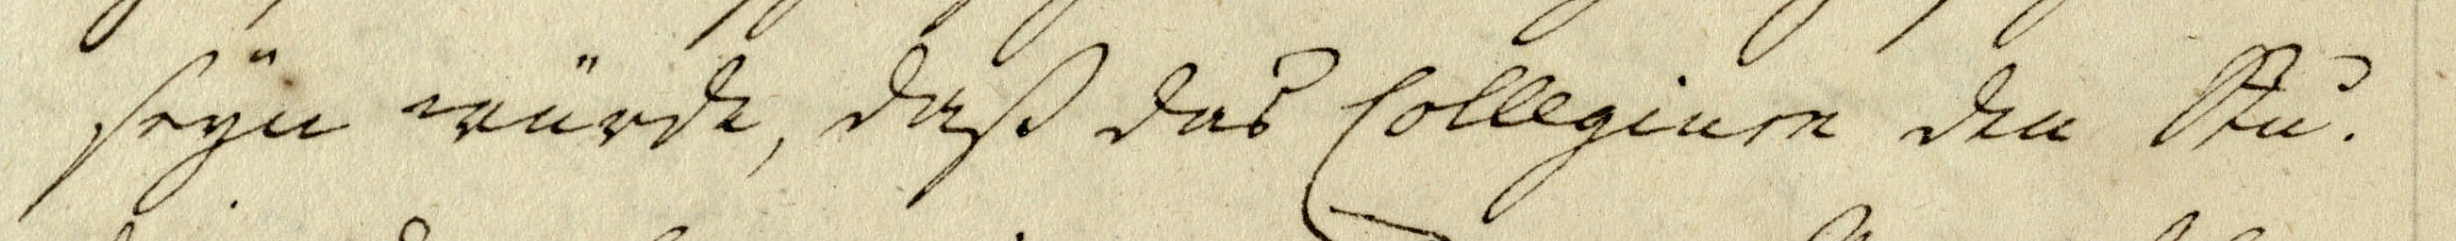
seÿn würde, daß das Collegium den Stu¬
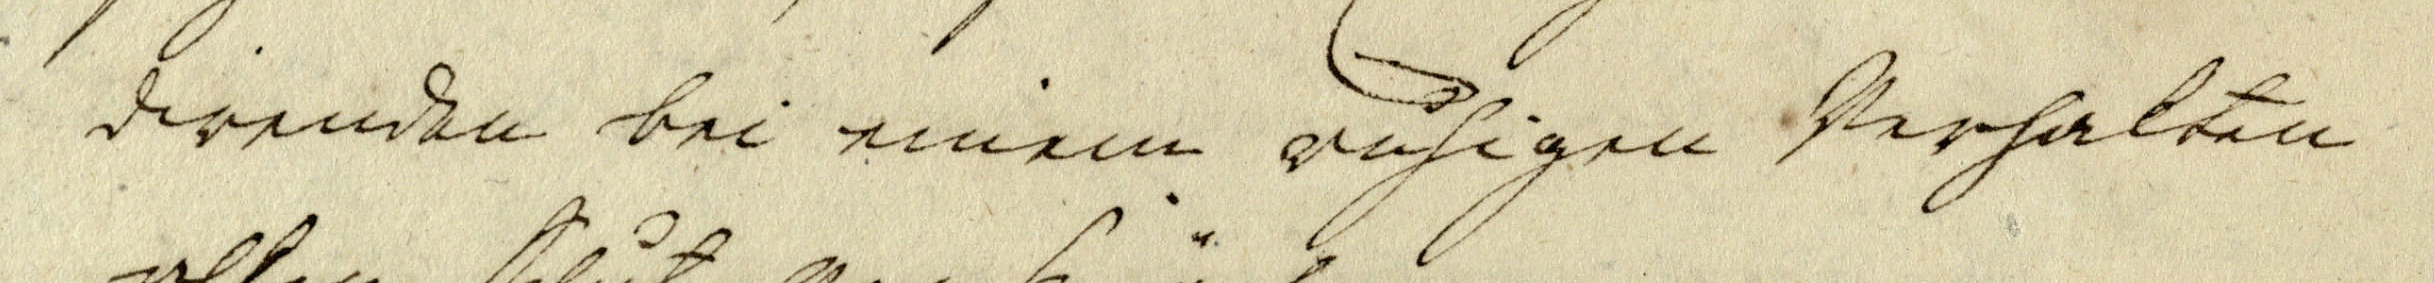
direnden bei einem ruhigen Verhalten
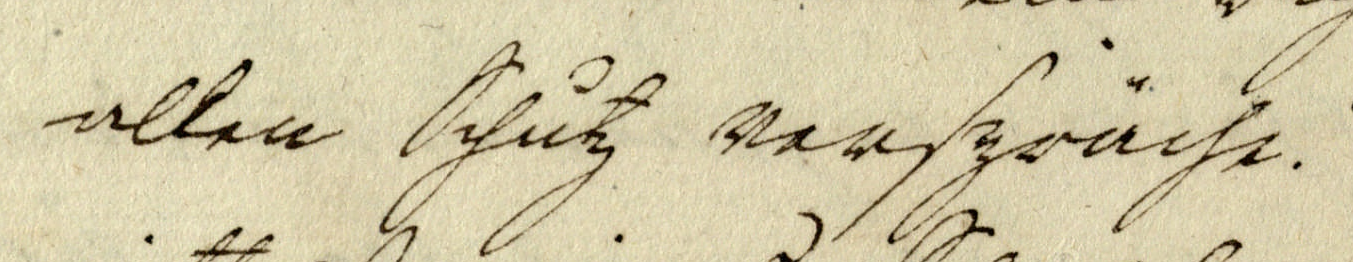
allen Schutz verspräche.
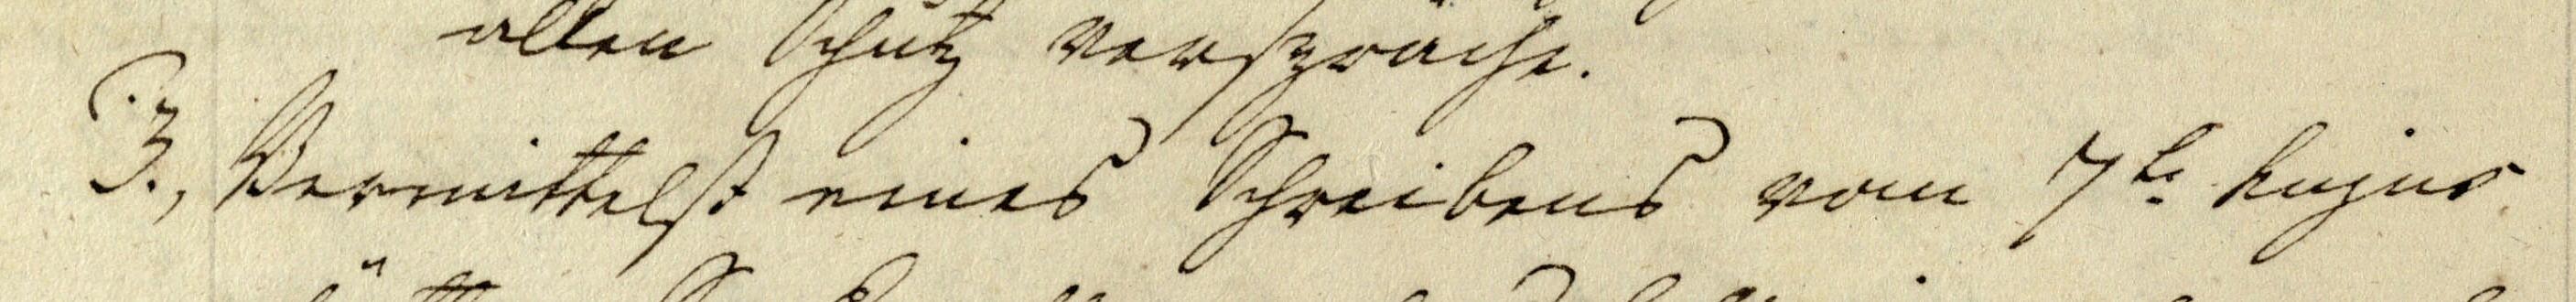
3. Vermittelst eines Schreibens vom 7 t hujus
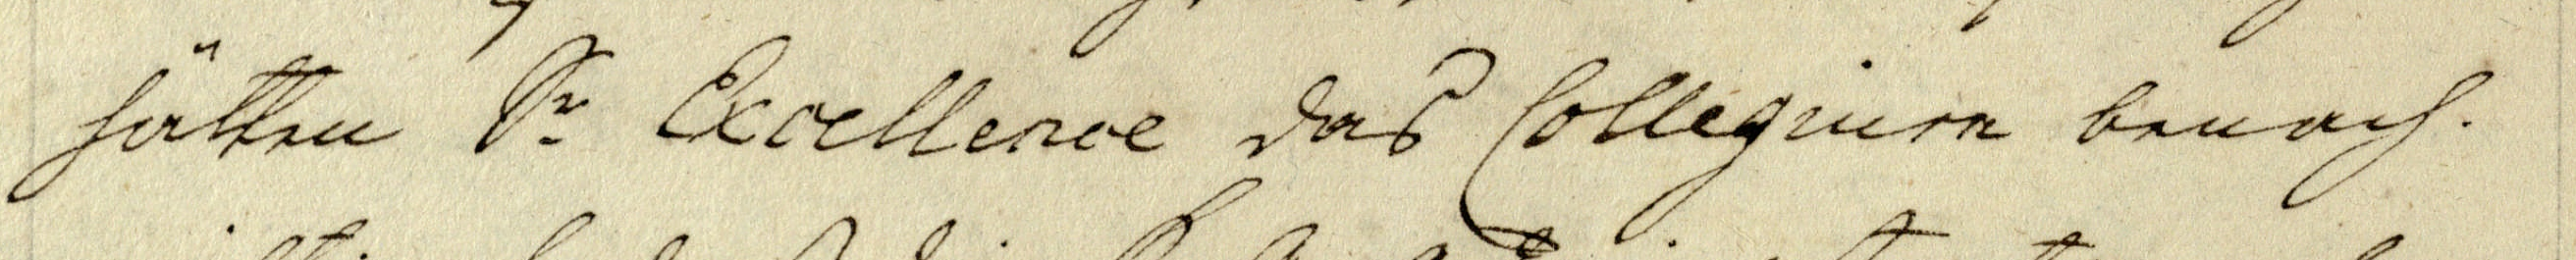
hätten Sr Excellence das Collegium benach¬
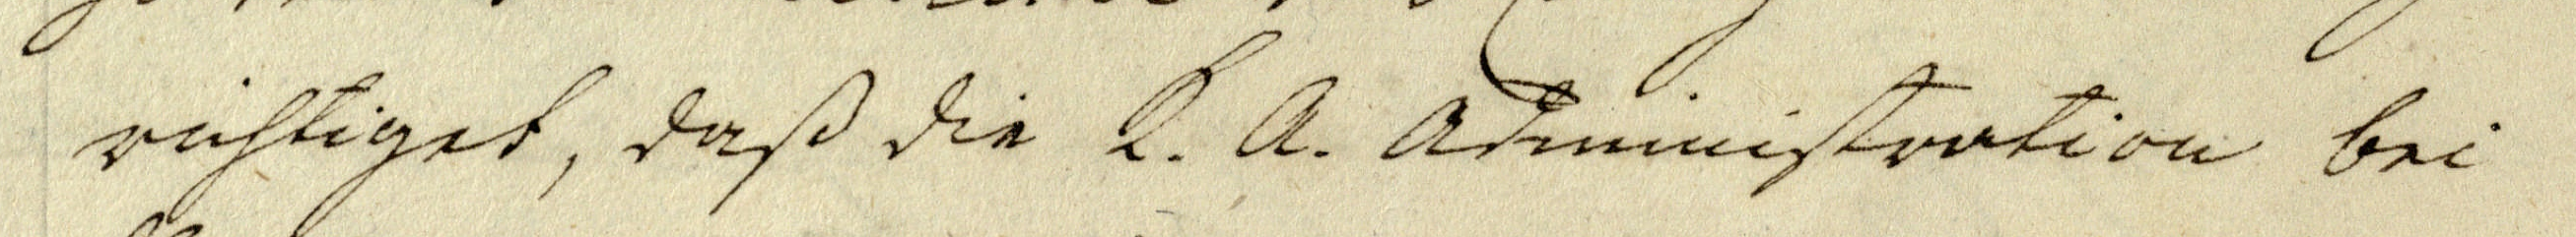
richtiget, daß die K. A. Administration bei
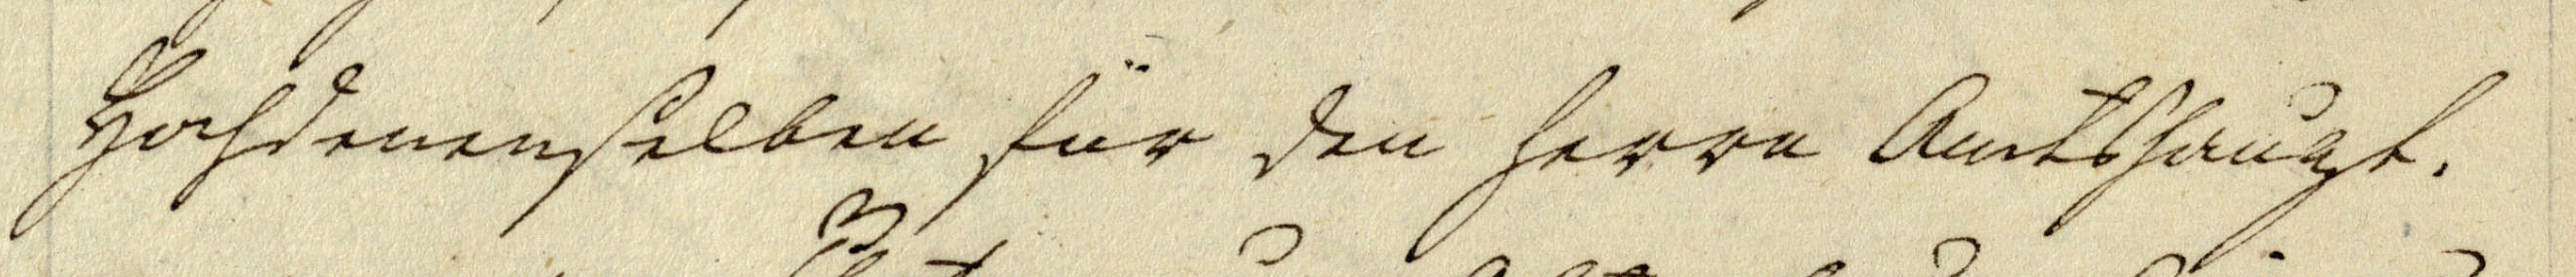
Hochdenenselben für den Herrn Amtshaupt¬
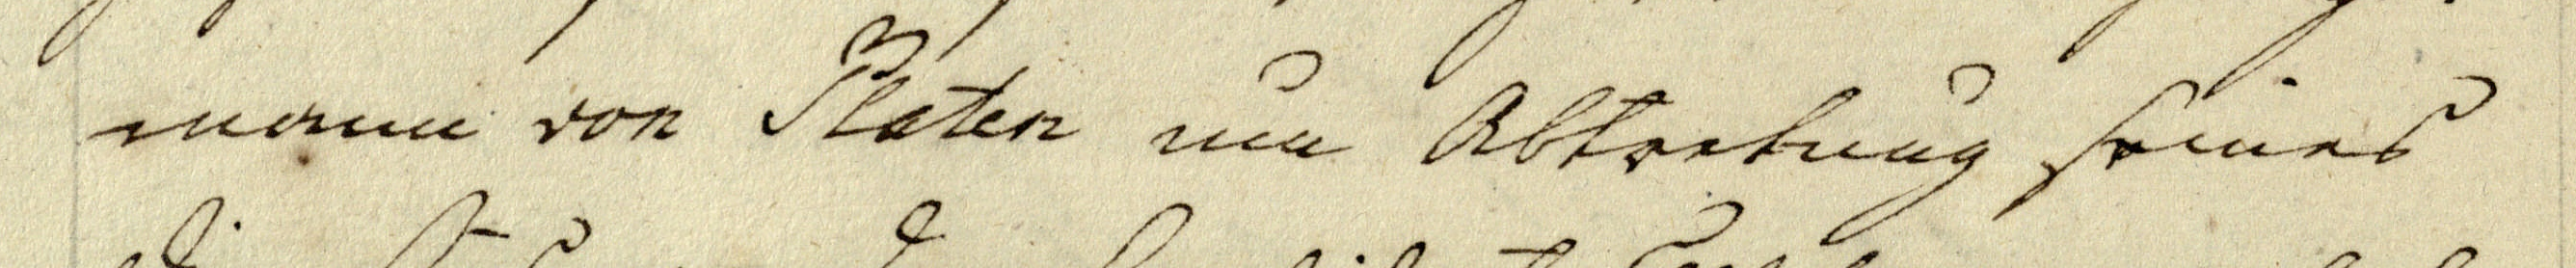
mann von Platen um Abtretung seines
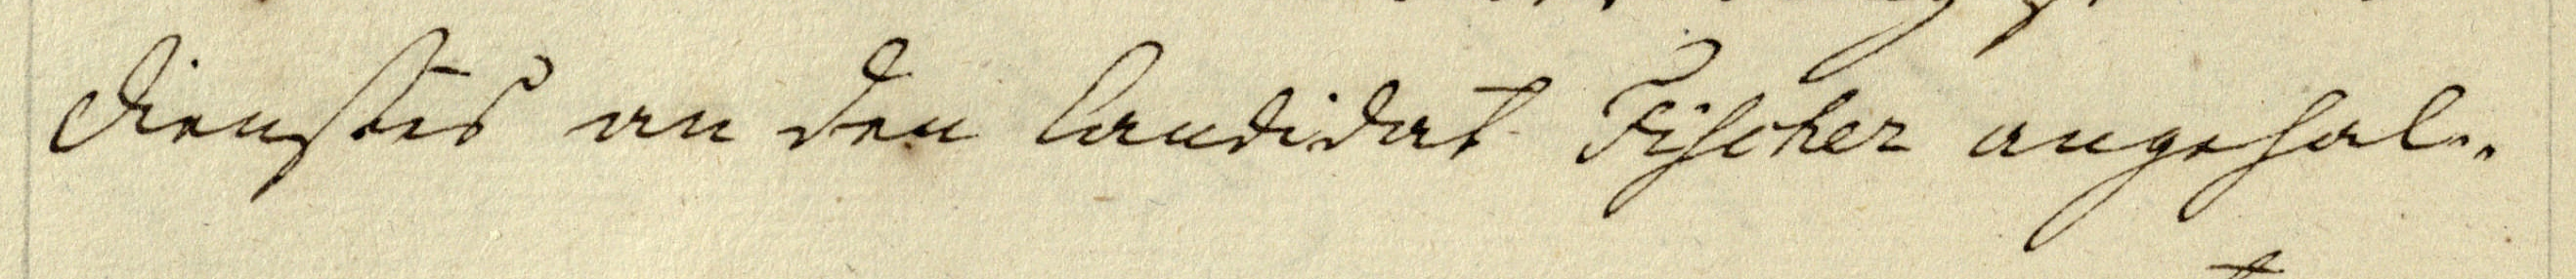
Dienstes an den Candidat Fischer angehal¬
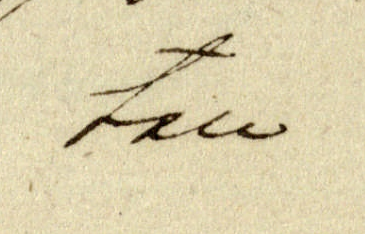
ten
